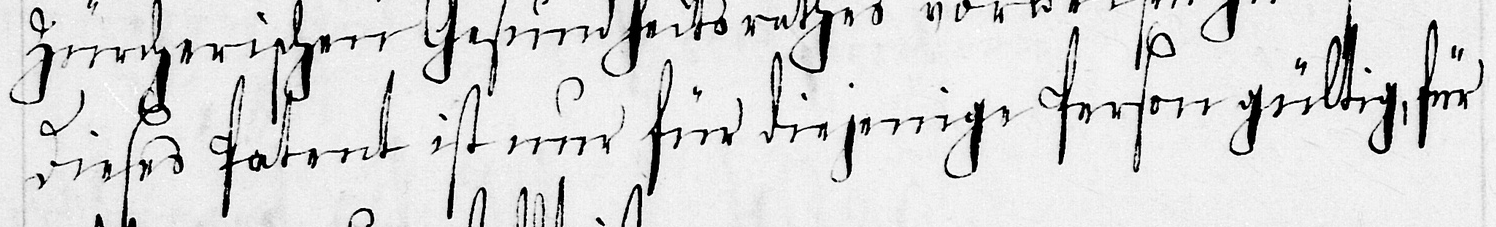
Dieses Patent ist nur für diejenige Person gültig, für
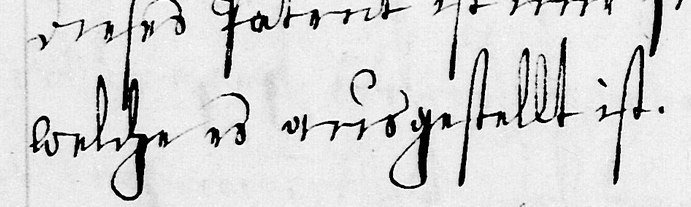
welche es ausgestellt is¬
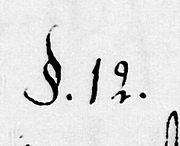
§. 12.
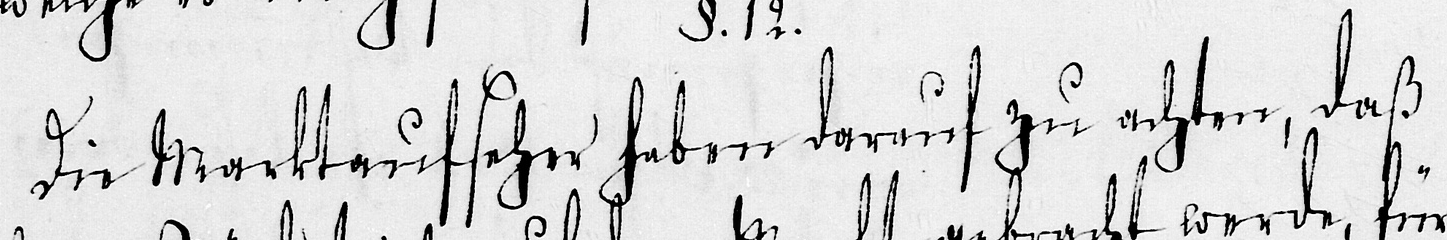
Die Marktaufseher haben darauf zu achten, daß
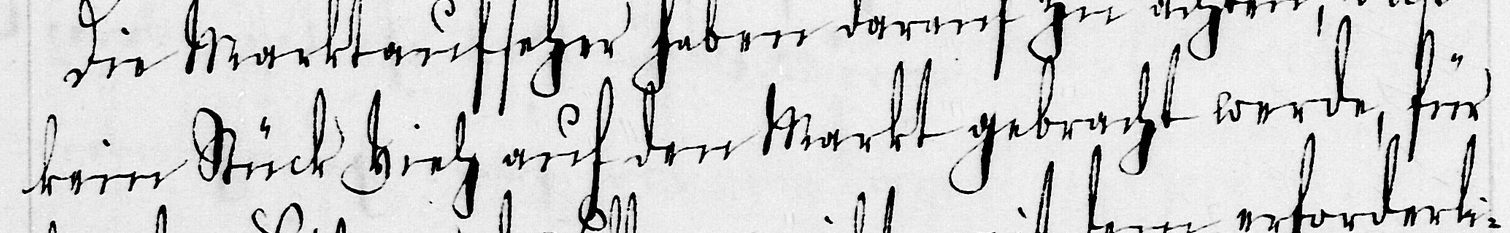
kein Stück Vieh auf den Markt gebracht werde, für
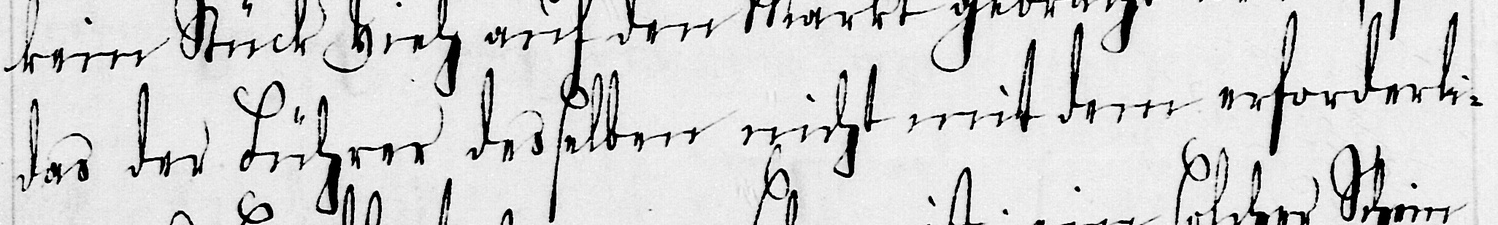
das der Führer desselben nicht mit dem erforderli¬
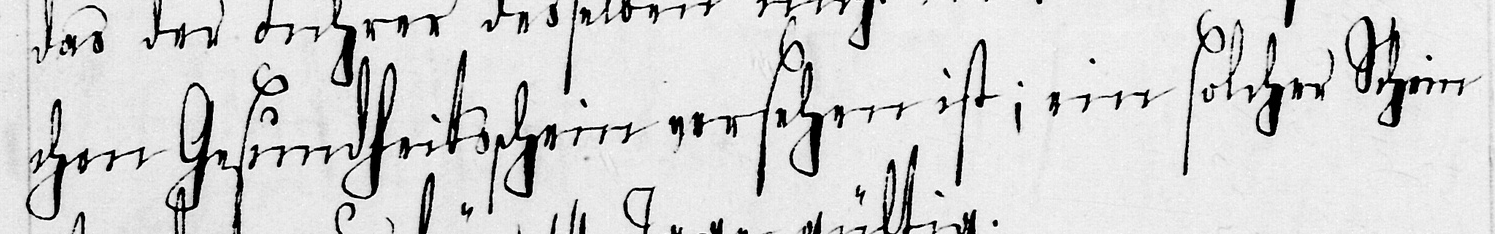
chen Gesundheitsschein versehen ist; ein solcher Schein
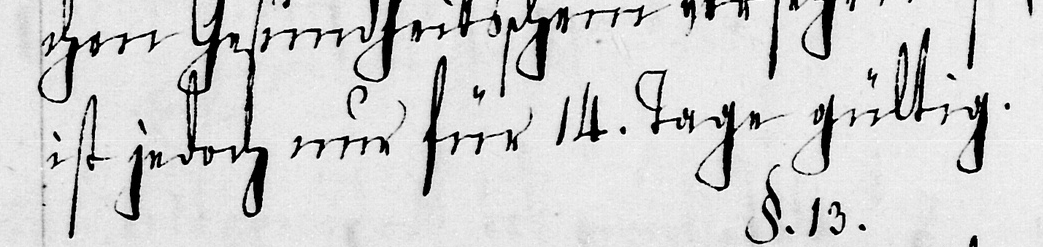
ist jedoch nur für 14. Tage gültig.
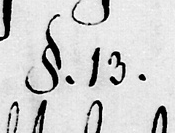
§. 13.
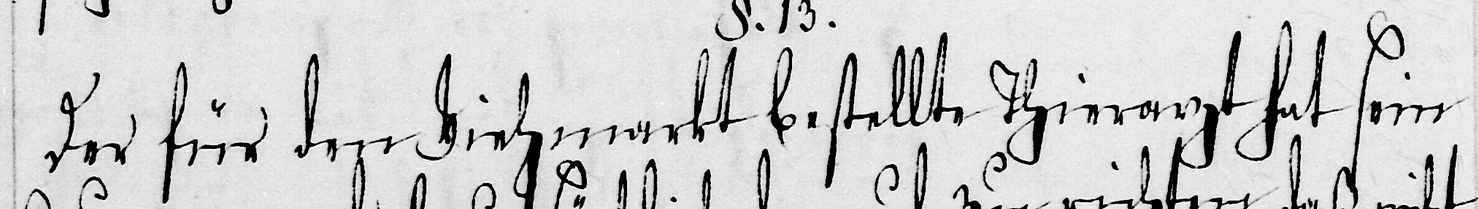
Der für den Viehmarkt bestellte Thierarzt hat sein
